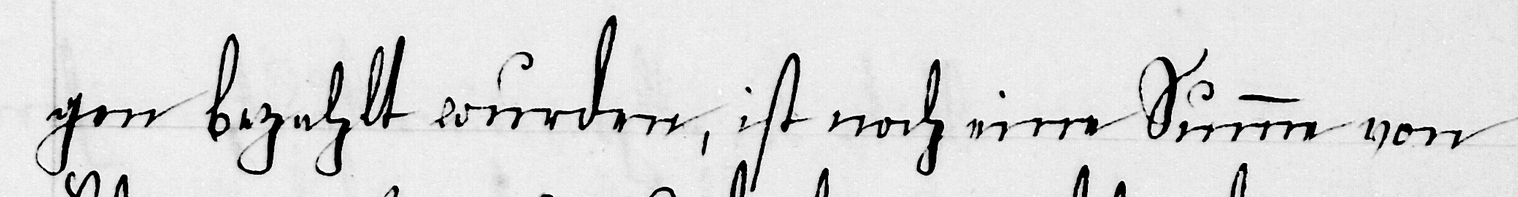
gen bezahlt wurden, ist noch eine Summe von
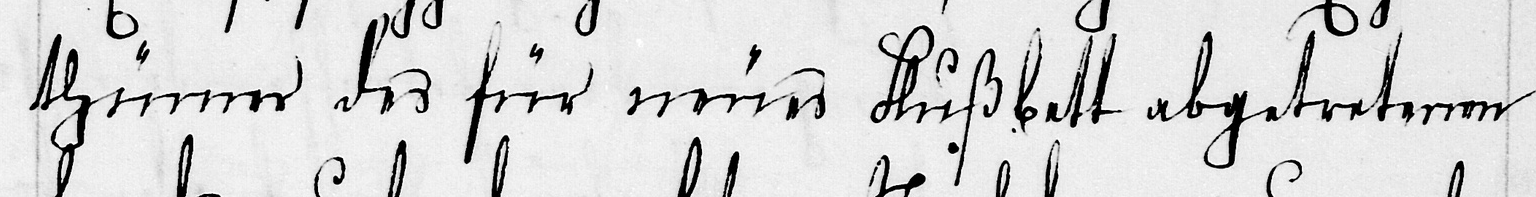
thümer des für neues Flußbett abgetretenen
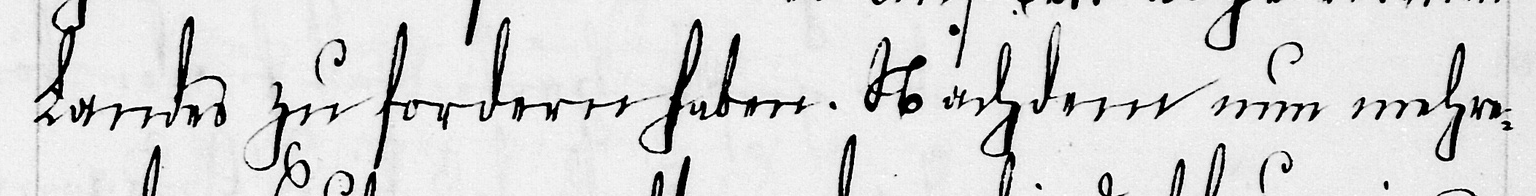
Landes zu fordern haben. Nachdem nun mehre¬
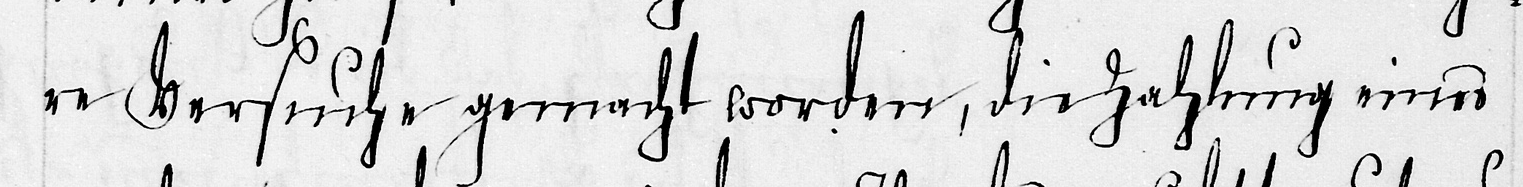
re Versuche gemacht worden, die Zahlung eines
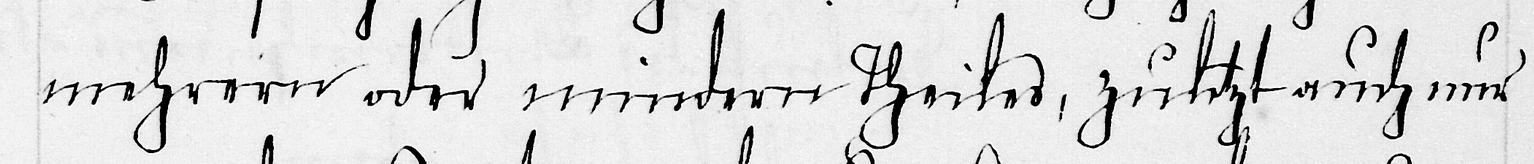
mehrern oder mindern Theiles, zuletzt auch nur
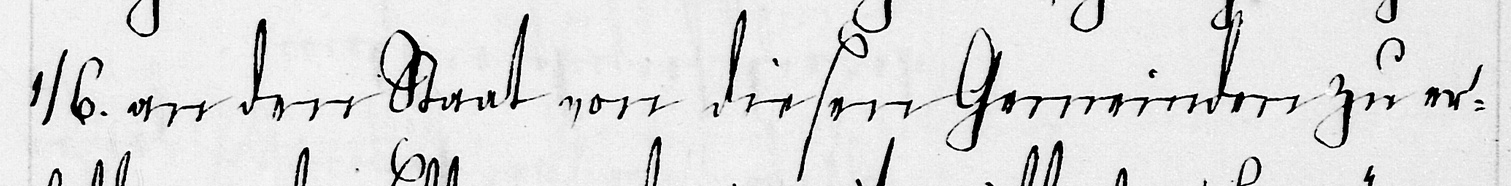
1/6. an den Staat von diesen Gemeinden zu er¬
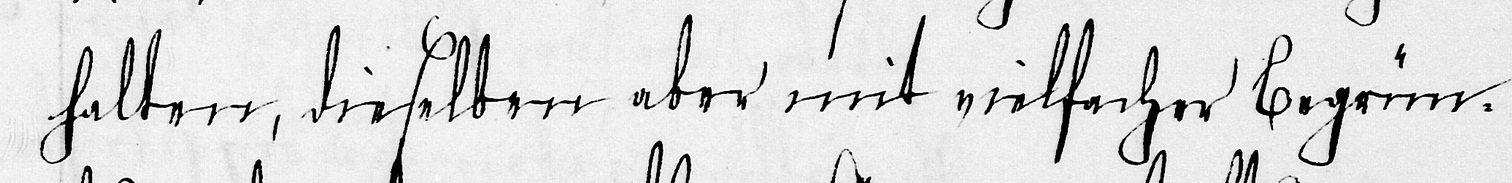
halten, dieselben aber mit vielfacher Begrün¬
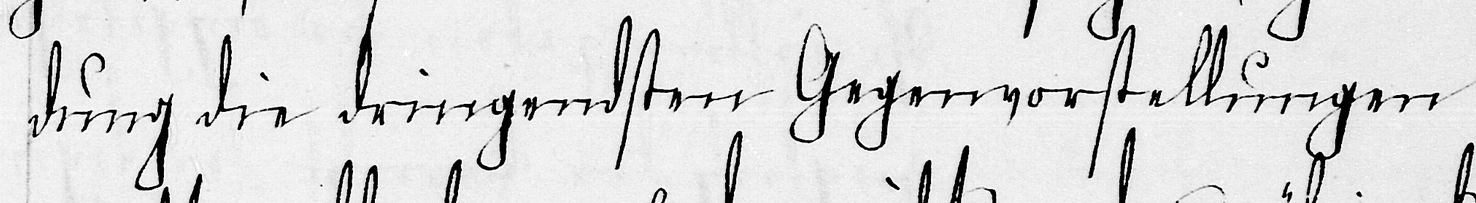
dung die dringendsten Gegenvorstellungen
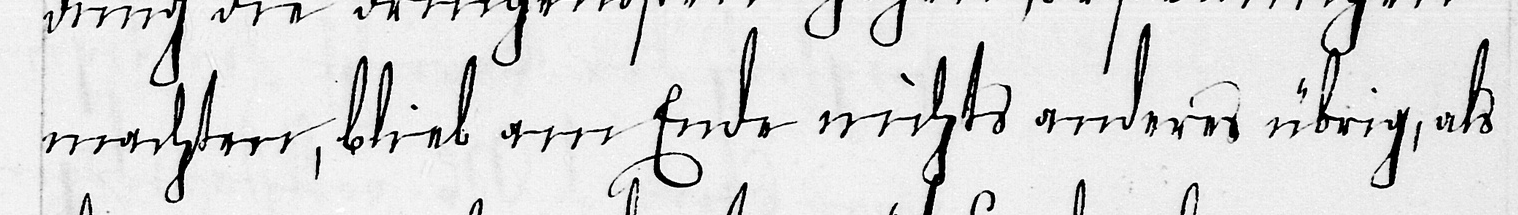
machten, blieb am Ende nichts anderes übrig, als
